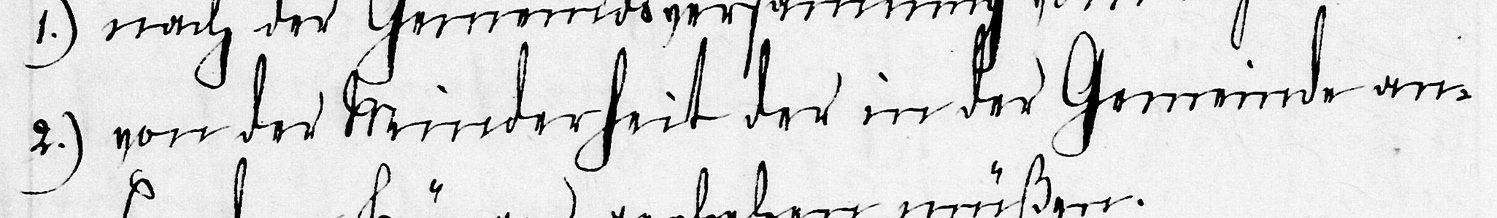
2.) von der Minderheit der in der Gemeinde an¬
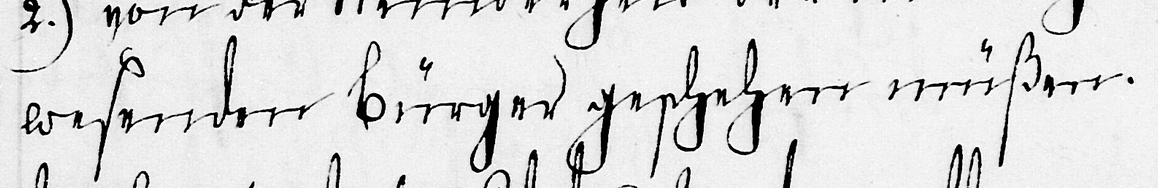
wesenden Bürger geschehen müßen.
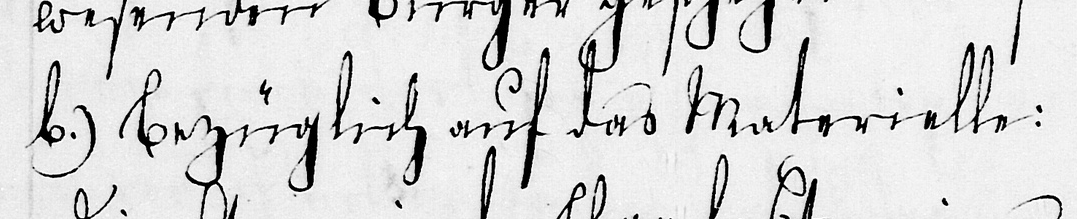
b.) Bezüglich auf das Materielle:
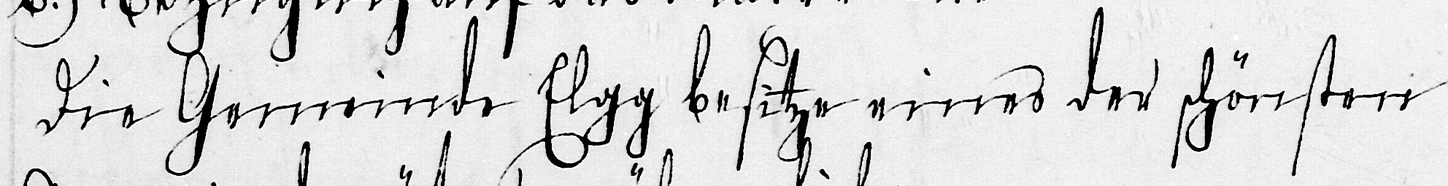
Die Gemeinde Elgg besitze eines der schönsten
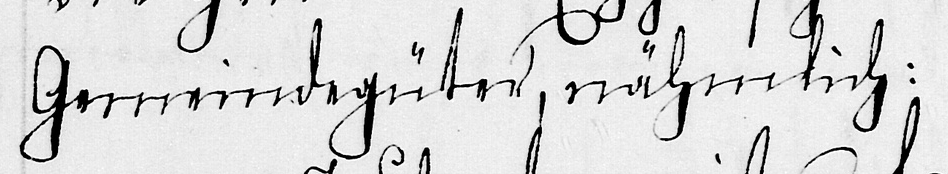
Gemeindegüter, nähmlich:
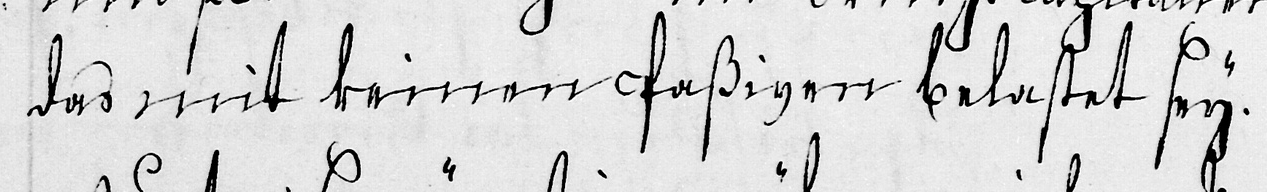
das mit keinen Paßiven belastet sey.
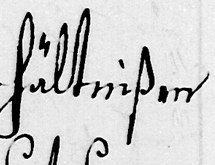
hältnißen
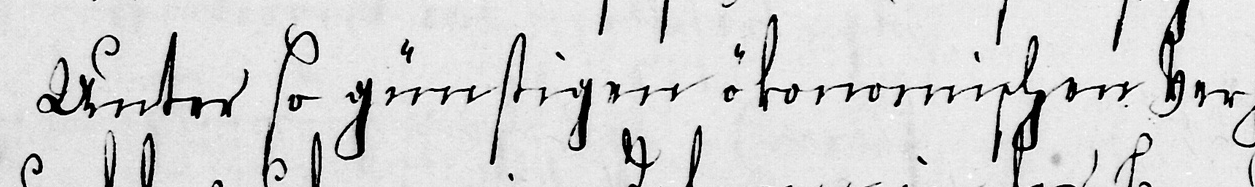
Unter so günstigen ökonomischen Ver¬
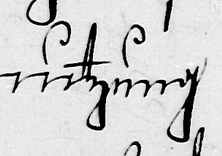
utzung
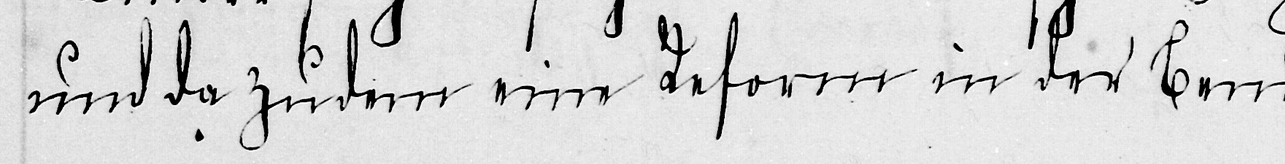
und da zudem eine Reform in der Ben¬
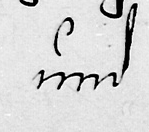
und
